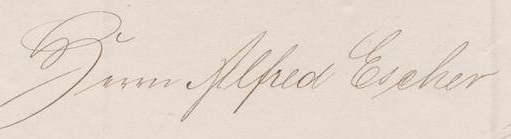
Herrn Alfred Escher
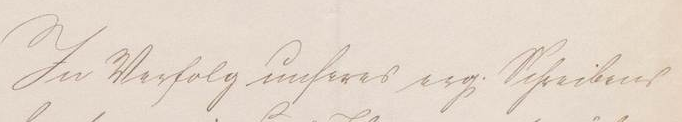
In Verfolg unseres erg. Schreibens
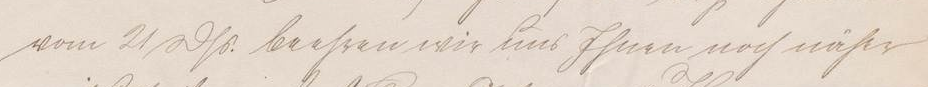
vom 21 Dss. beehren wir uns Ihnen noch näher
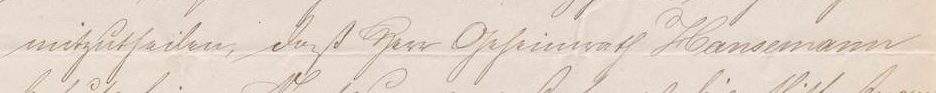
mitzutheilen, daß Herr Geheimrath Hansemann
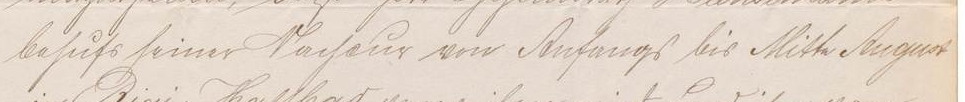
behufs seiner Nachcur von Anfangs bis Mitte August
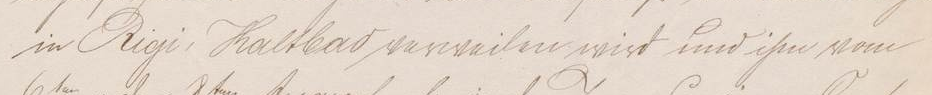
in Rigi, Kaltbad verweilen wird und ihm vom
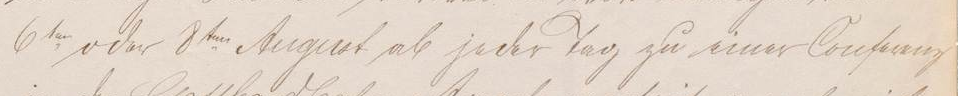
6ten oder 8ten August ab jeden Tag einer Conferenz
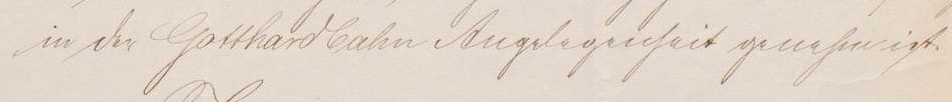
in der Gotthardbahn Angelegenheit genehmigt.
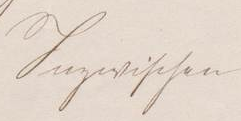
Inzwischen
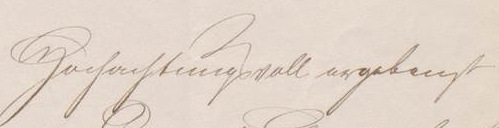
Hochachtungsvoll ergebenst
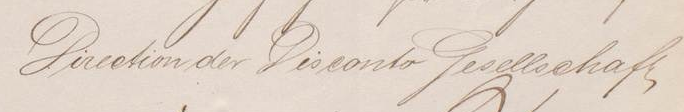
Direction der Disconto Gesellschaft
